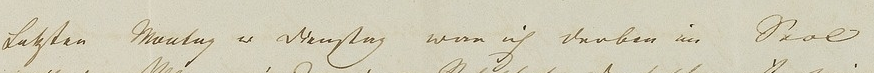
Letzten Montag & Dienstag war ich droben in Sool
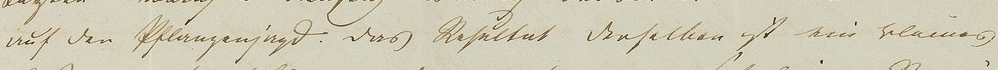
auf der Pflanzenjagd. Das Resultat derselben ist ein kleines
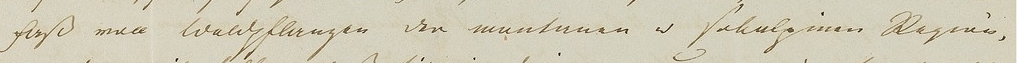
Faß voll Waldpflanzen der montanen & subalpinen Region,
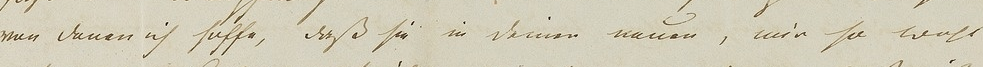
von denen ich hoffe, daß sie in Deiner neuen, mir so wohl
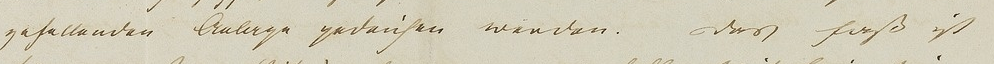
gefallenden Anlage gedeihen werden. Das Faß ist
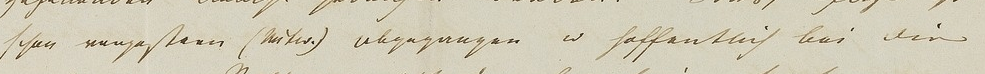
schon vorgestern (Mitw.) abgegangen & hoffentlich bei dir
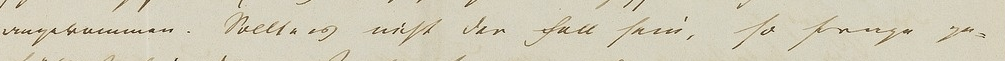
angekommen. Sollte es nicht der Fall sein, so frage ge-
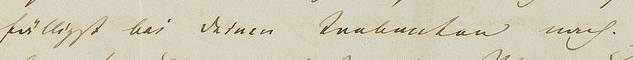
fälligst bei Deinen Trabanten nach.
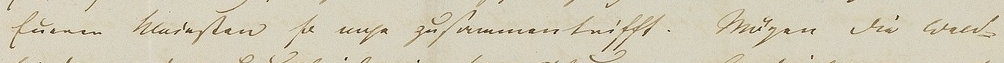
Euerer Kleinsten so nahe zusammentrifft. Mögen die Wald-
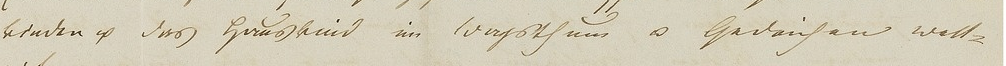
kinder & das Hauskind im Wachsthum & Gedeihen wett-
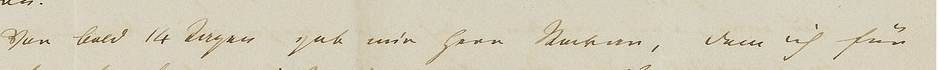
Vor bald 14 Tagen gab mir Herr Stockar, dem ich für
